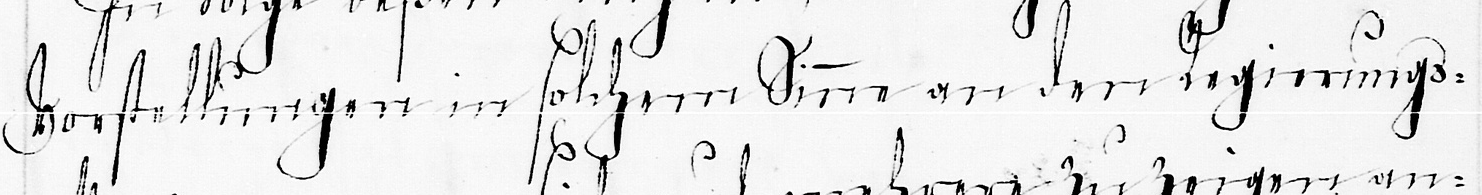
Vorstellungen in solchem Sinne an den Regierungs¬
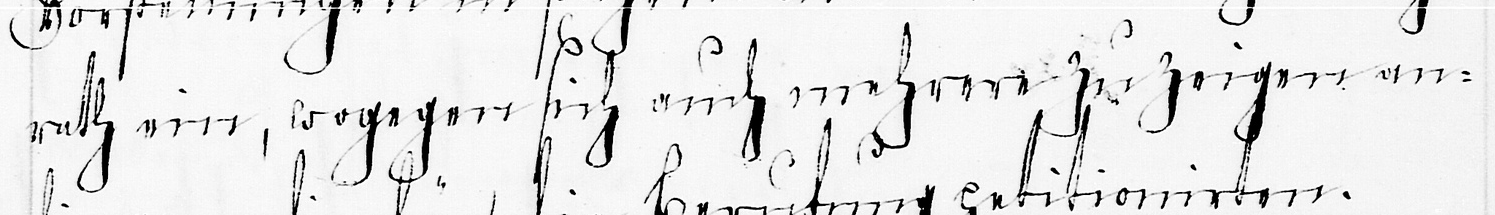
rath ein, wogegen sich auch mehrere zu zeigen an¬
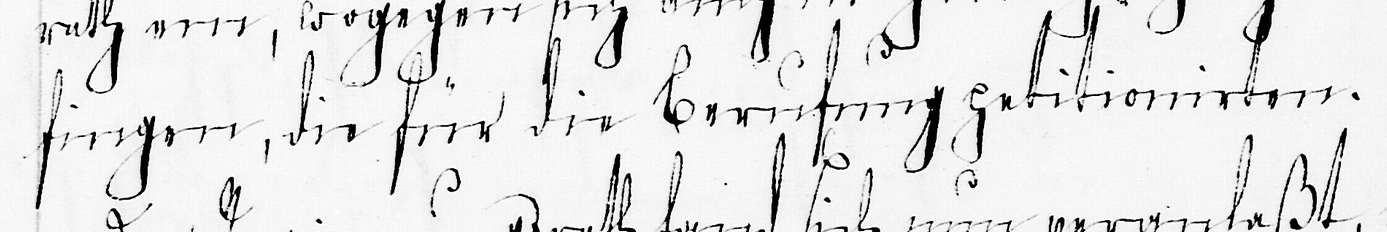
fingen, die für die Berufung petitionirten.
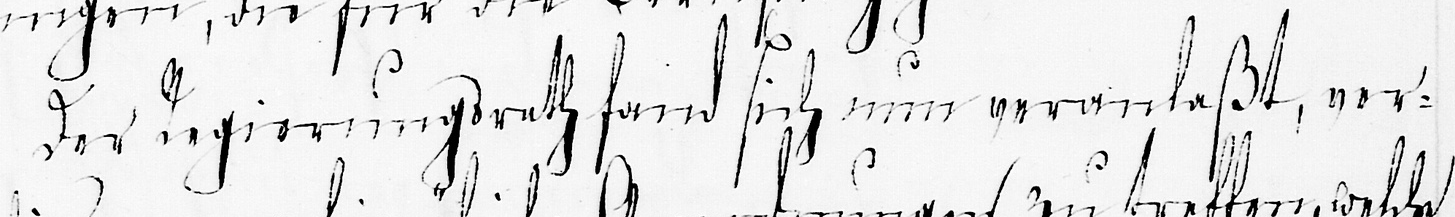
Der Regierungsrath fand sich nun veranlaßt, ver¬
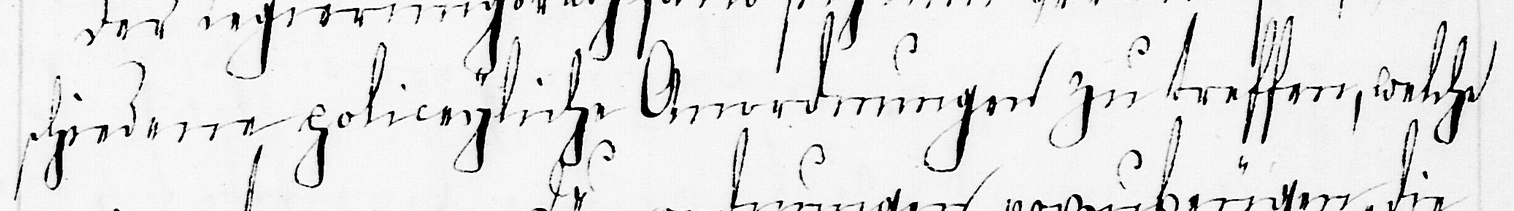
schiedene policeyliche Anordnungen zu treffen, welche
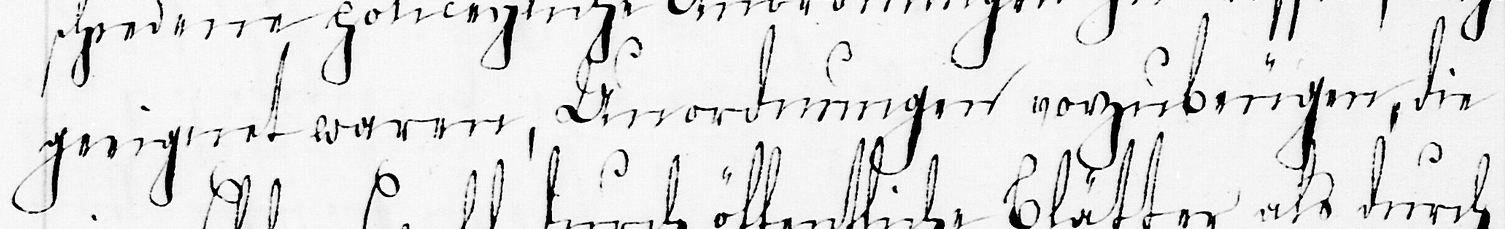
geeignet waren, Unordnungen vorzubeugen, die
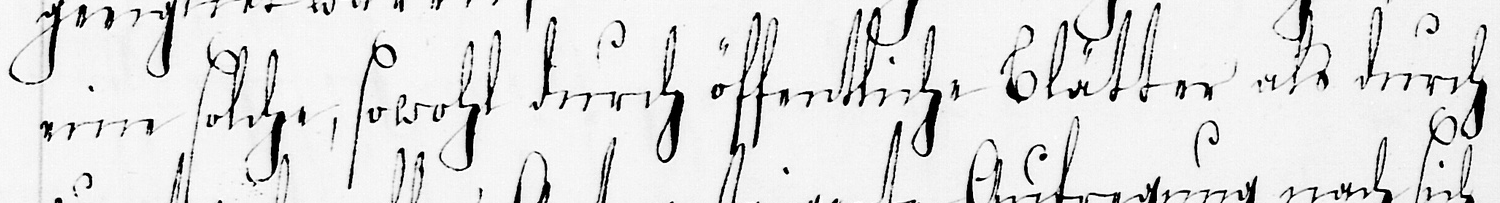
eine solche, sowohl durch öffentliche Blätter als durch
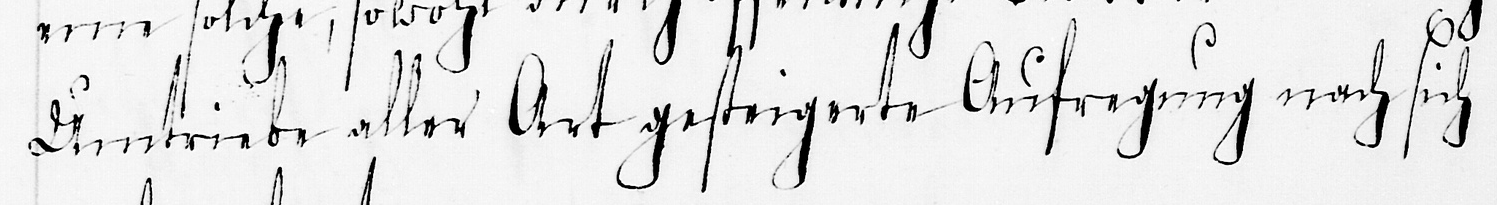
Umtriebe aller Art gesteigerte Aufregung nach sich
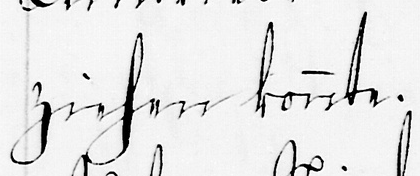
ziehen konnte.
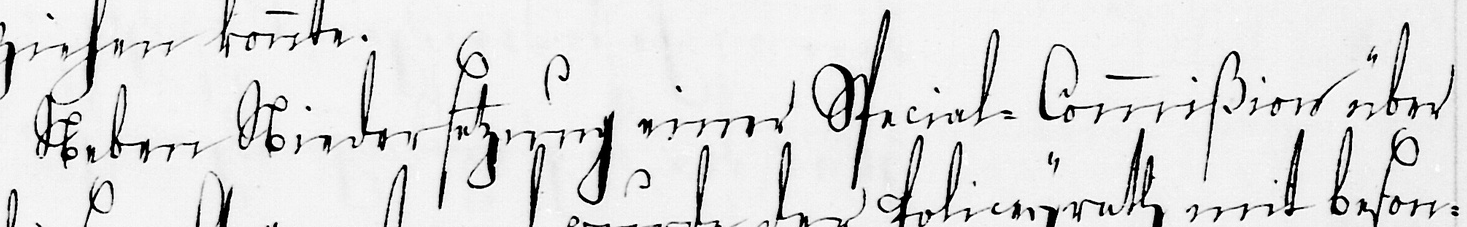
Neben Niedersetzung einer Special-Commißion über
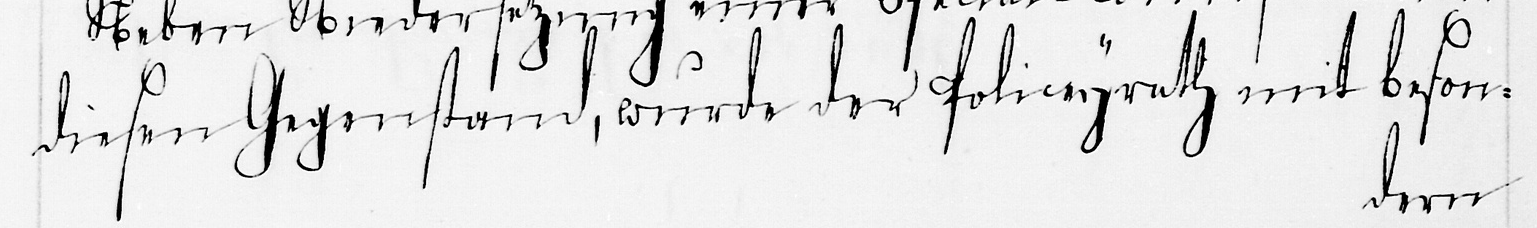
diesen Gegenstand, wurde der Policeyrath mit beson-
